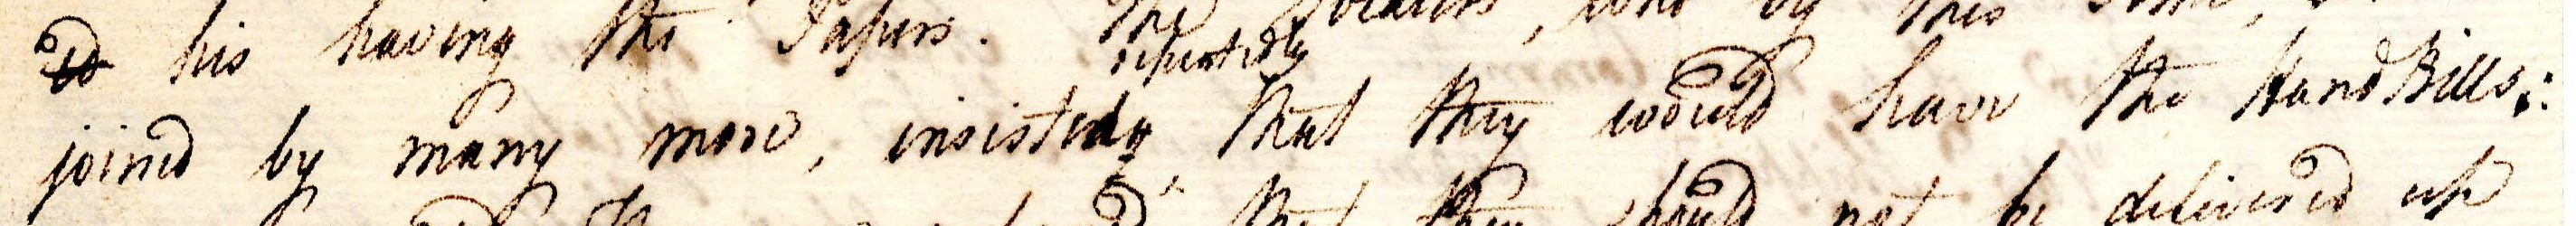joined by many more, insisted that they would have the Hand Bills:
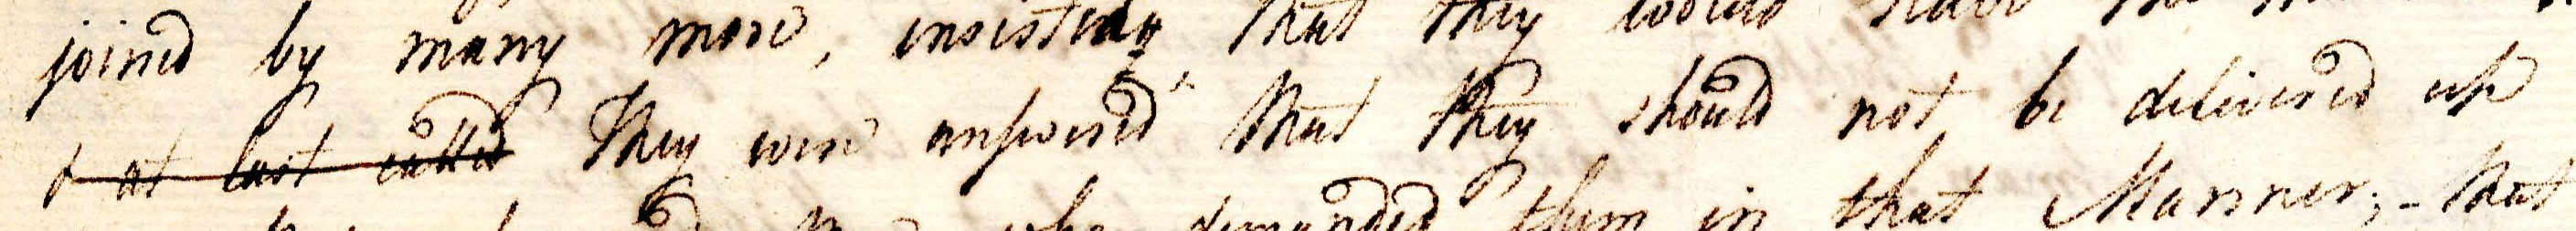[& at last called] They were answered that they should not be delivered up
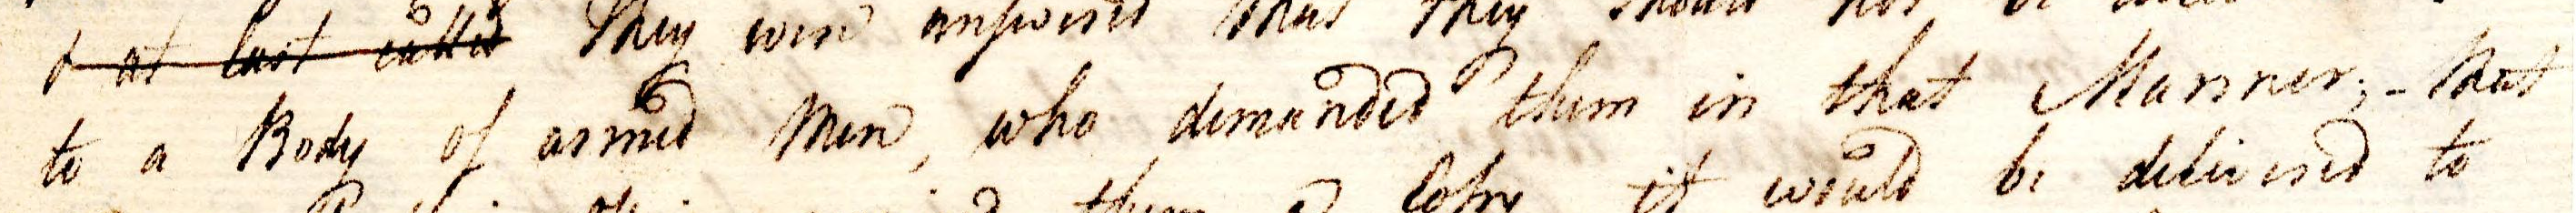to a Body of armed Men who demanded them in that Manner; That
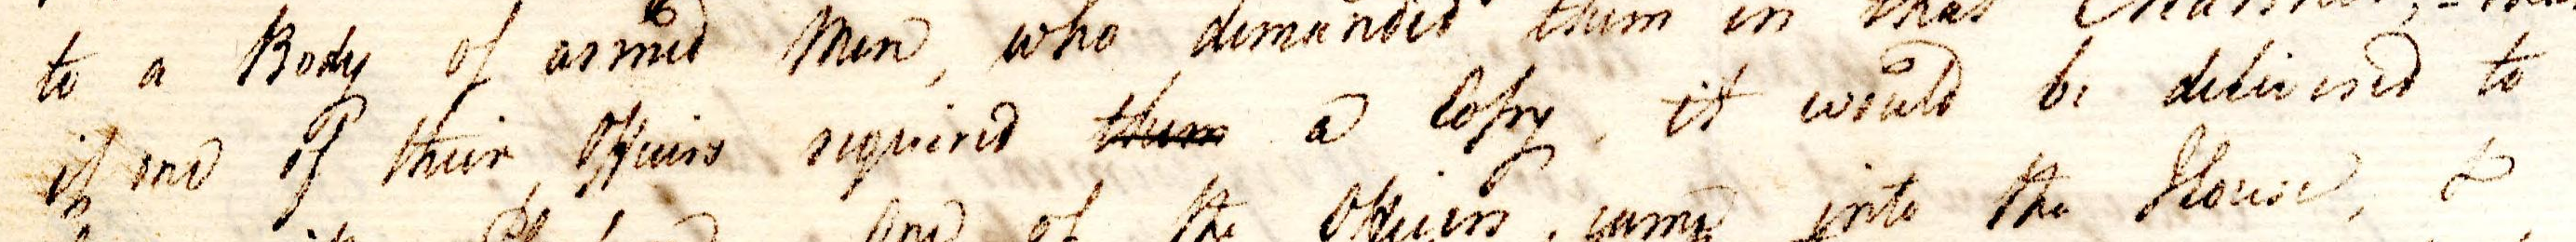if one of their Officers required them a Copy, it would be delivered to
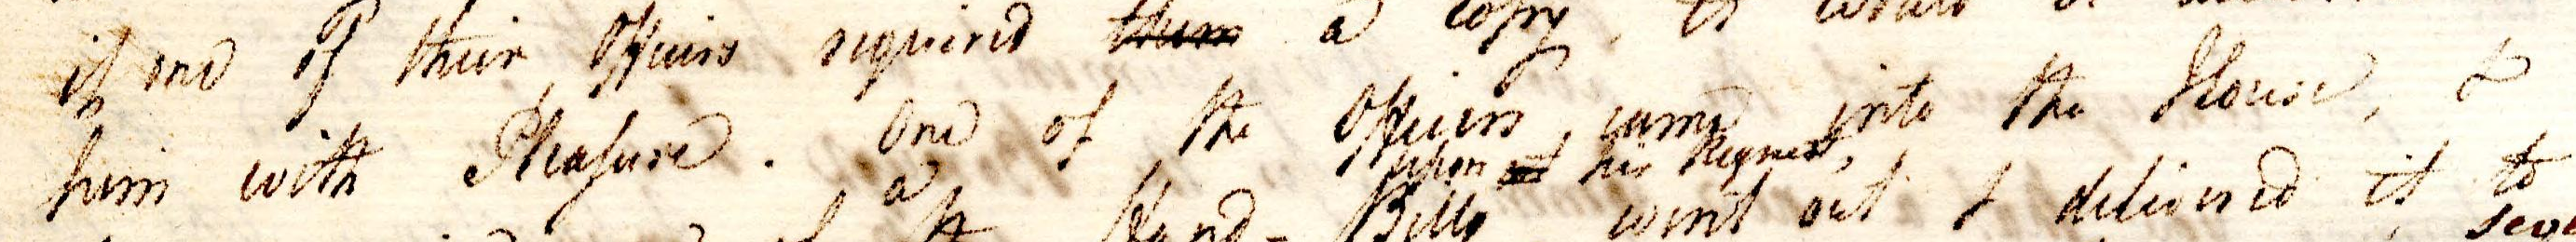him with Pleasure. One of the Officers came into the House, &
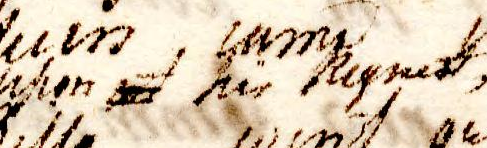whom at his request
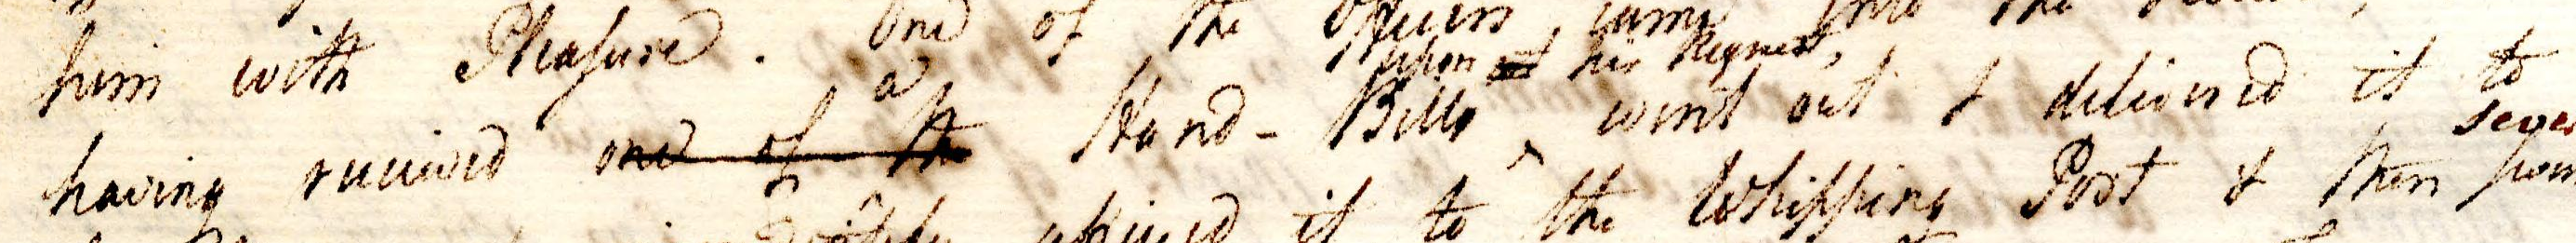having received one of the ^ Hand- Bills ^ went out & delivered it to
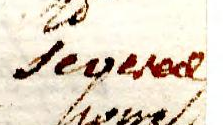severe
